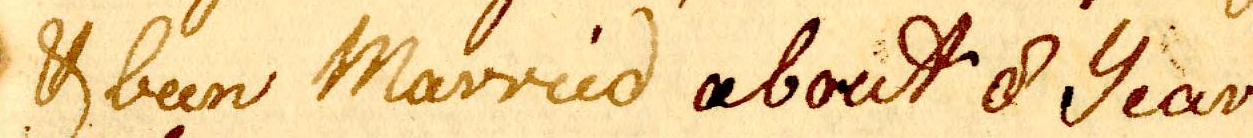& been Married about 8 Year
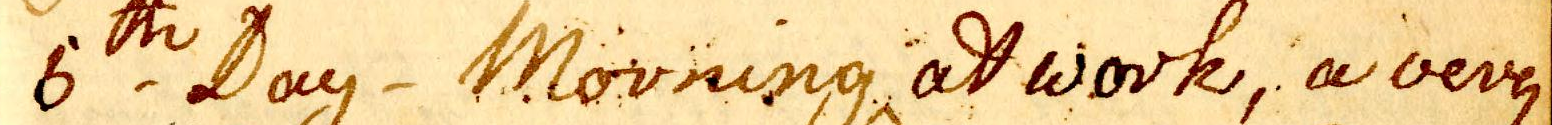5^th Day- Morning at work, a very
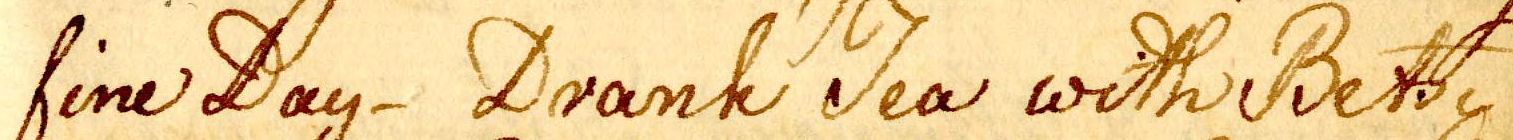fine Day- Drank Tea with Betsy
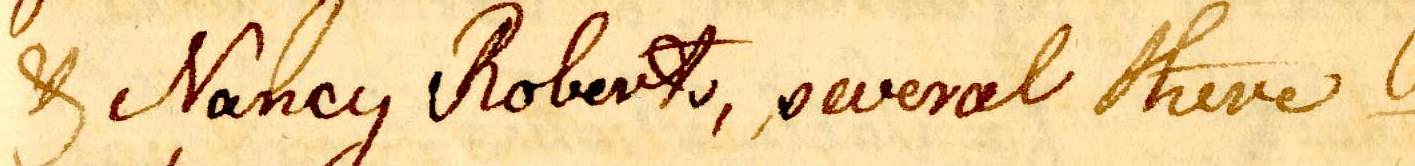& Nancy Roberts, several there
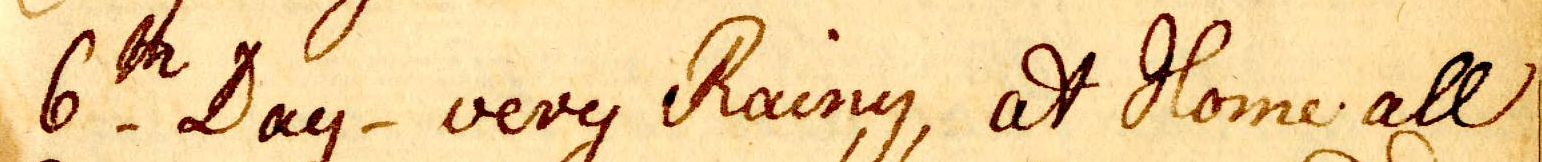6^th Day- very Rainy, at Home all
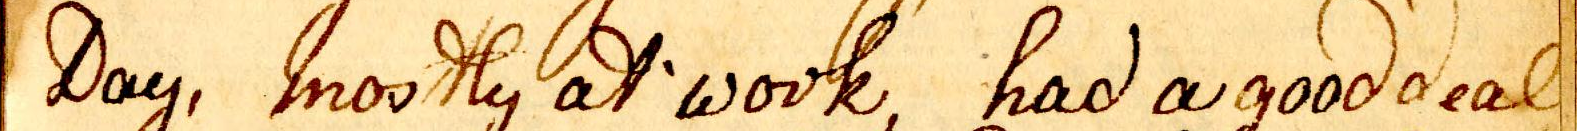Day, mostly at work, had a good deal
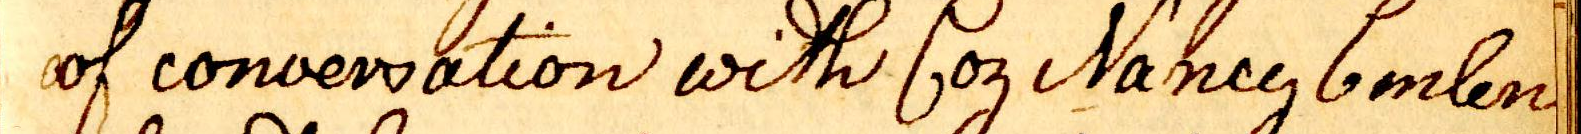of conversation with Coz Nancy Emlen
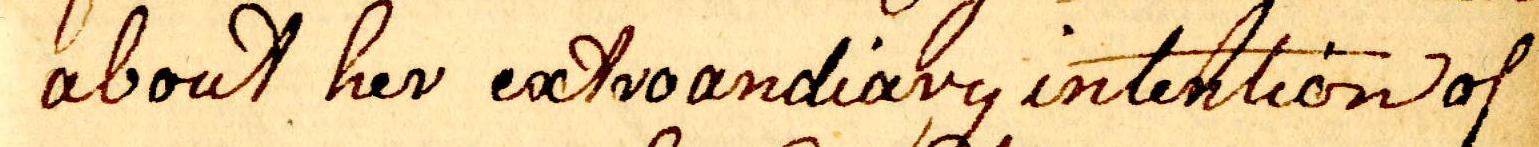about her extroandiary intention of
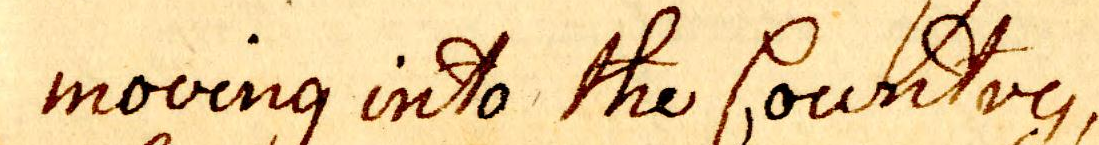moving into the Country,
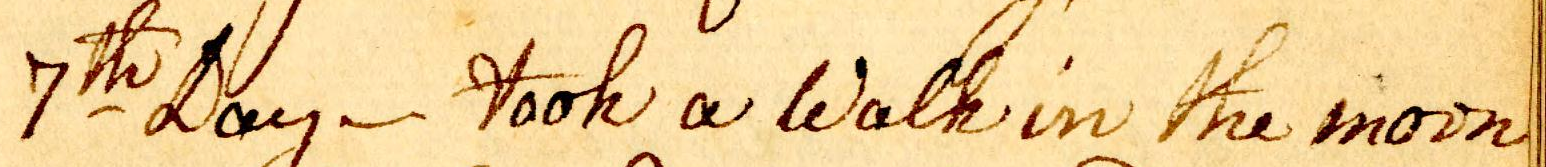7^th Day- took a Walk in the morn
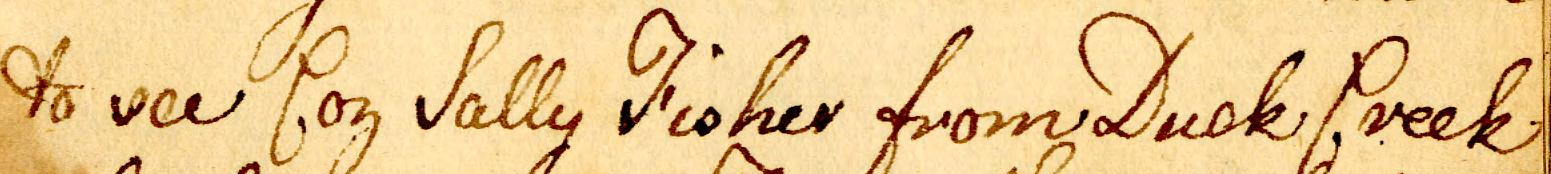to see Coz Sally Fisher from Duck Creek
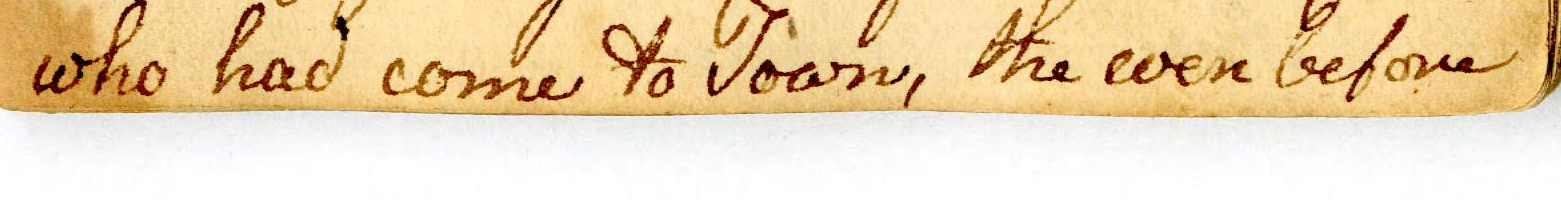who had come to Town, the even before
